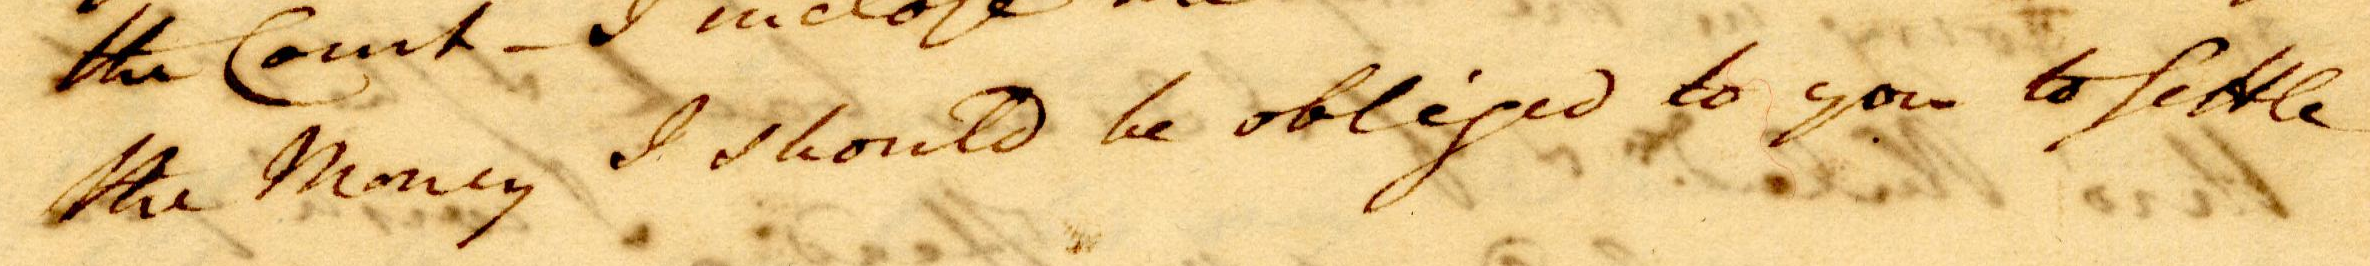the money I should be obliged to you to settle
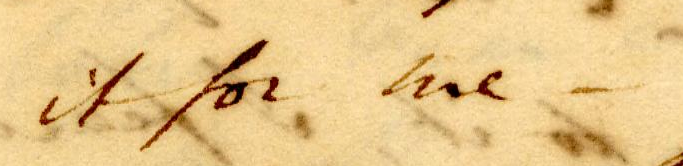it for me.
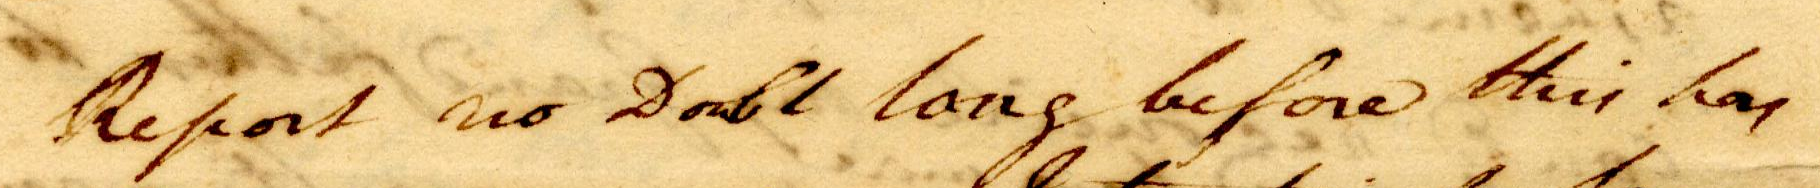Report no Doubt long before this has
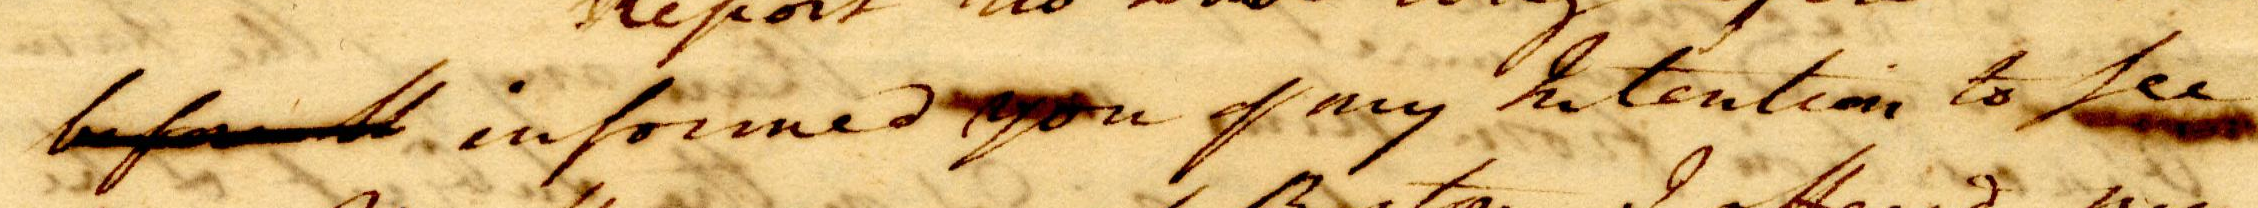[before] all informed you of my Intention to see
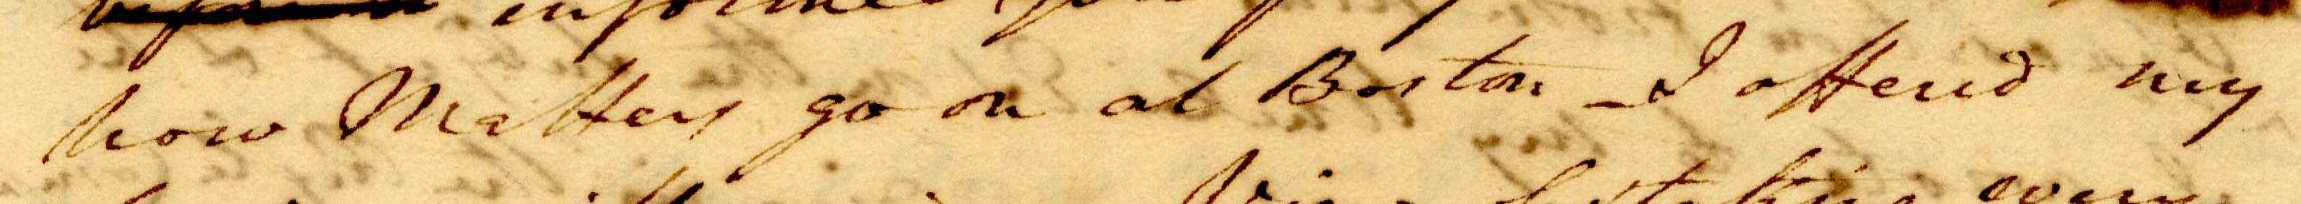how Matters go on at Boston. I offered my
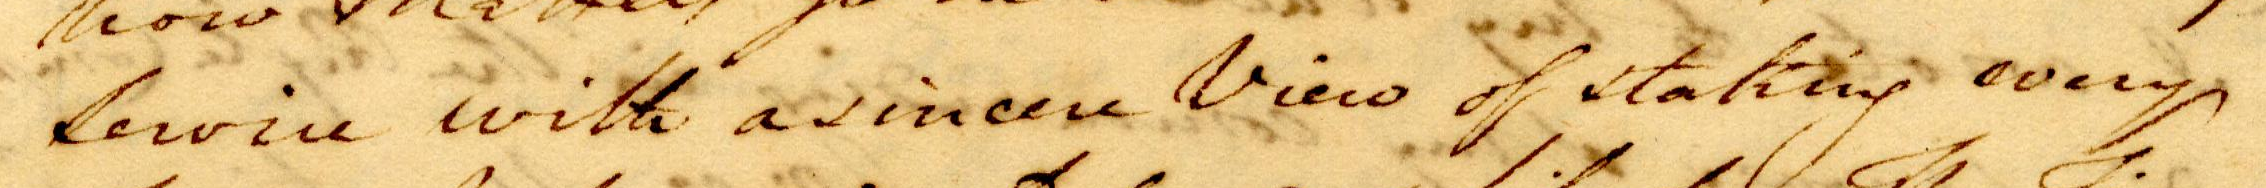Service with a sincere View of staking every
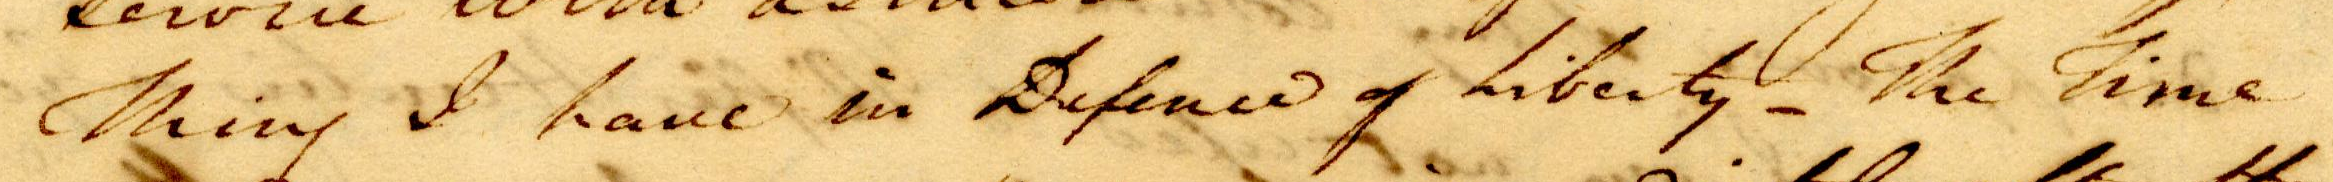thing I have in Defence of Liberty. The Time
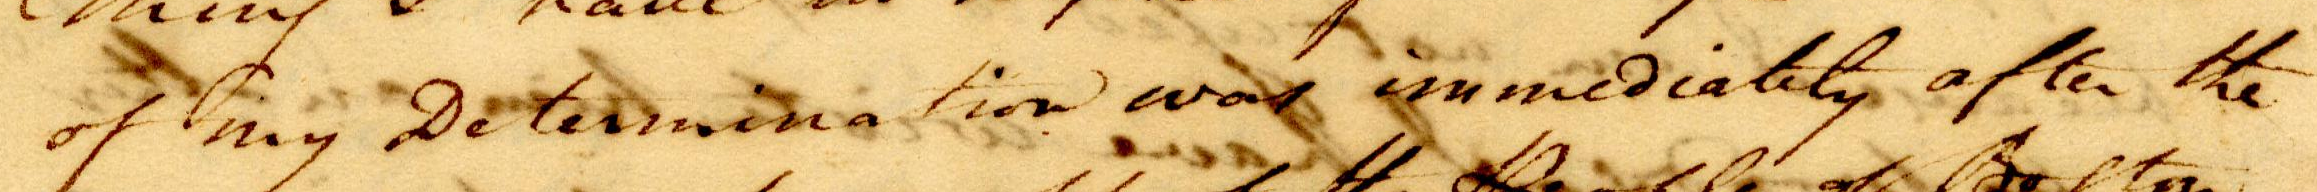of my Determination was immediately after the
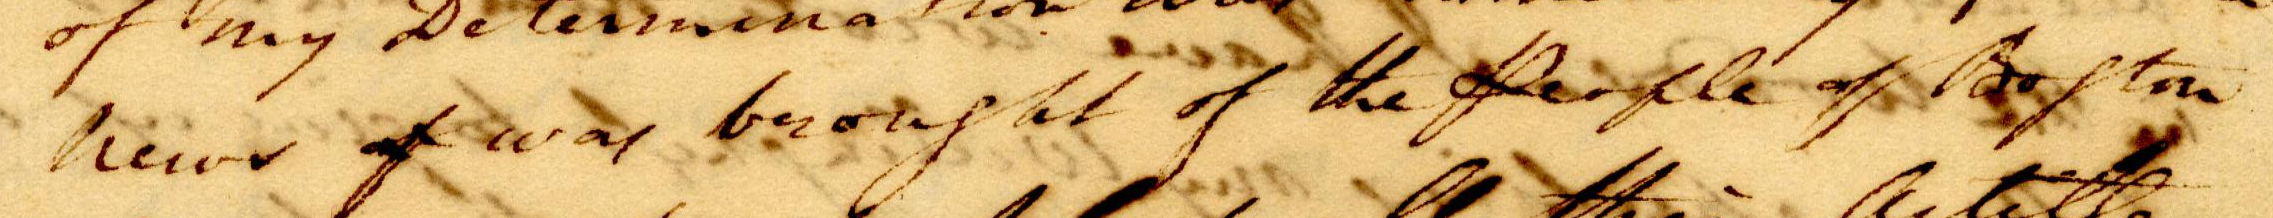news of war brought of the People of Boston
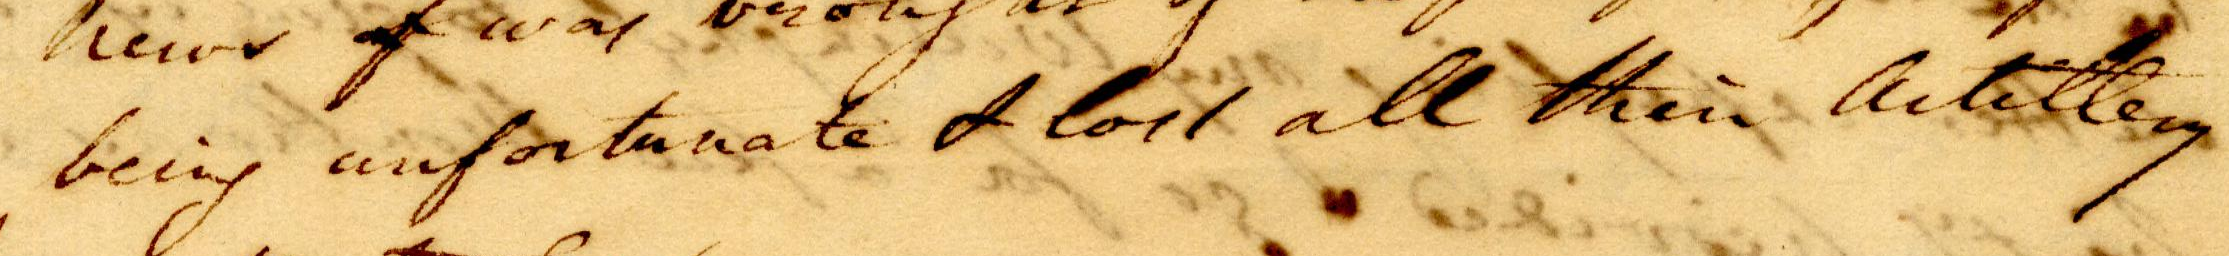being unfortunate & lost all their Artillery
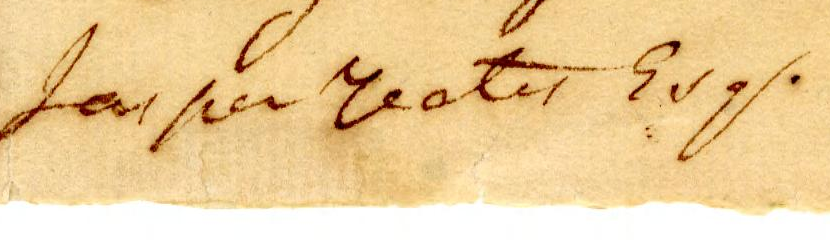Jasper Yeates Esq^r
